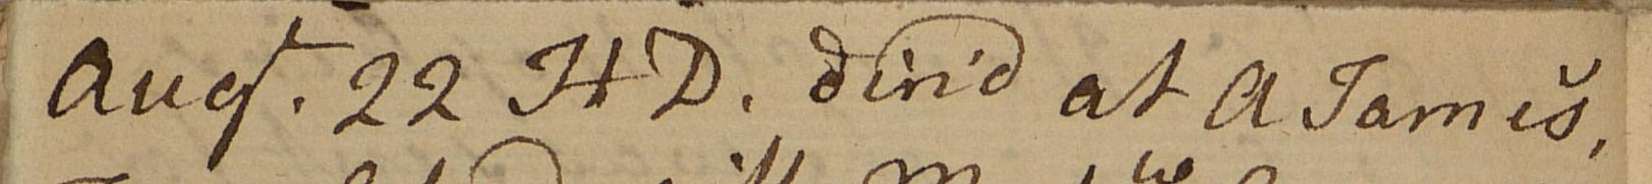Aug^t. 22 HD. din'd at A James^s,
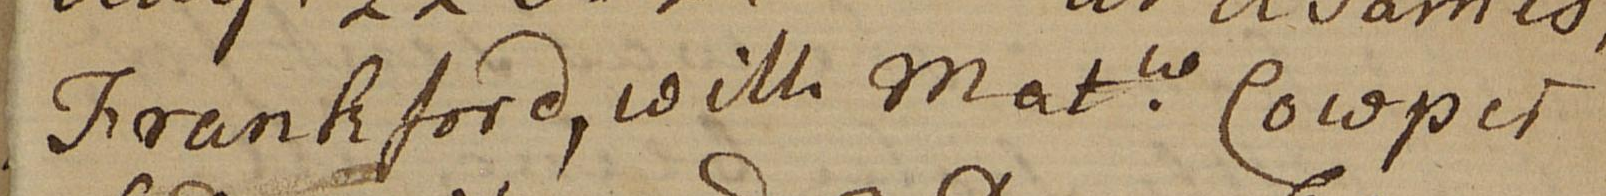Frankford, with Mat^w. Cowper
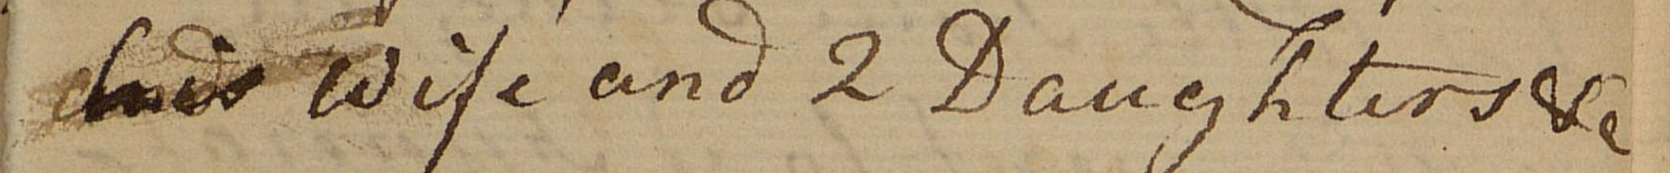his Wife and 2 Daughters &c
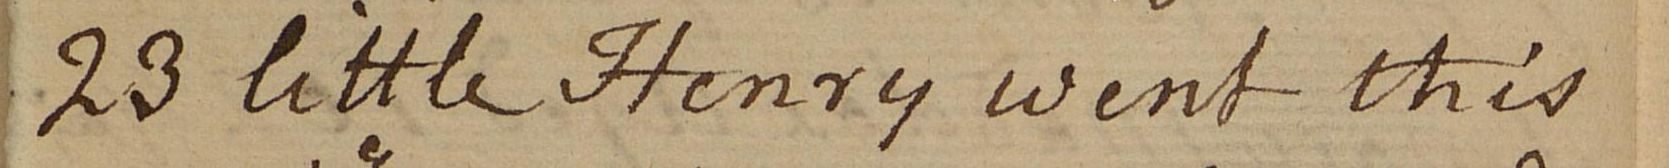23 little Henry went this
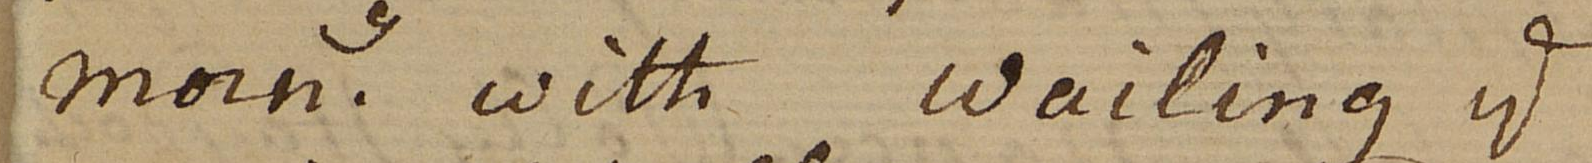morn^g. with wailing y^e
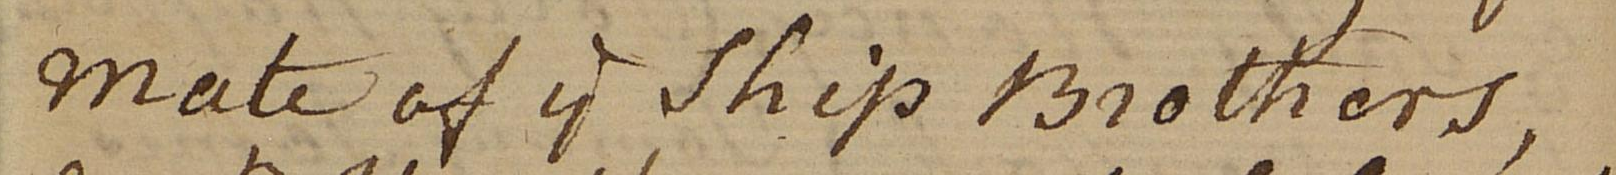Mate of y^e Ship Brothers,
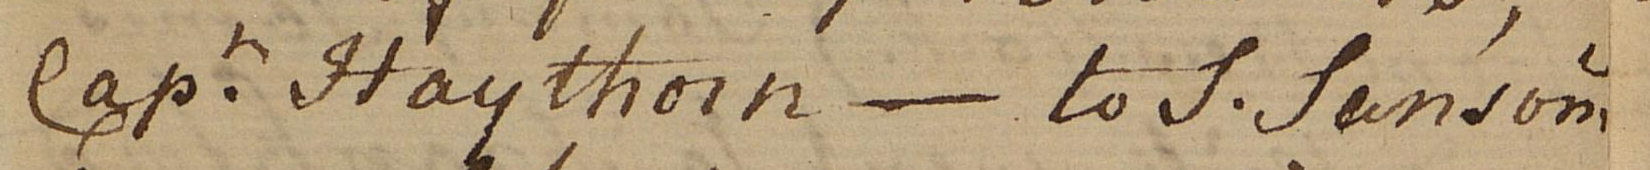Cap^t. Haythorn- to S. Sansom^s
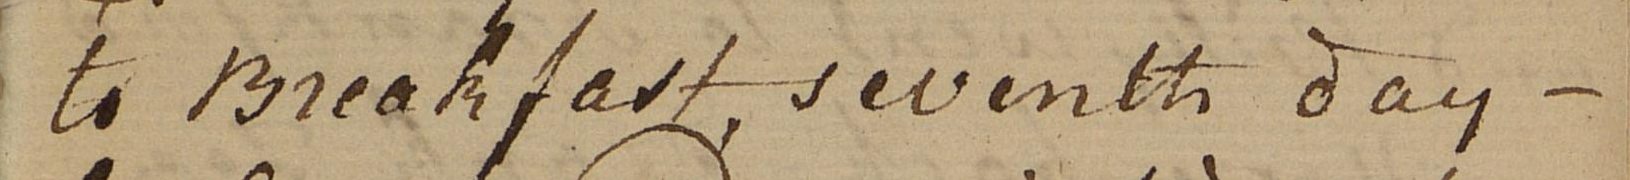to Breakfast seventh day-
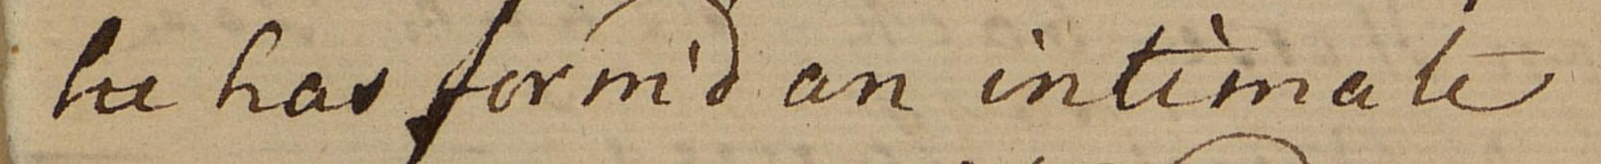he has form'd an intimate
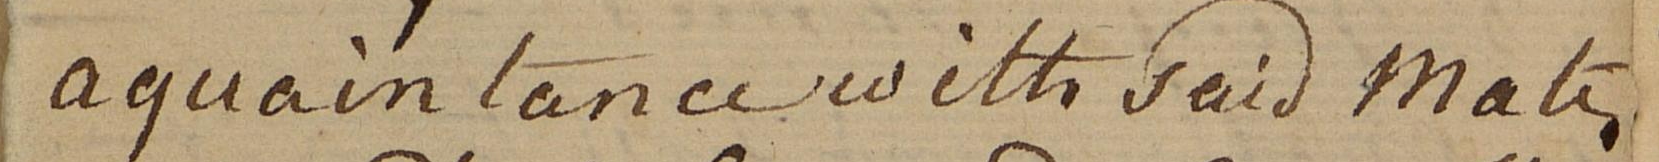aquaintance with said Mate,
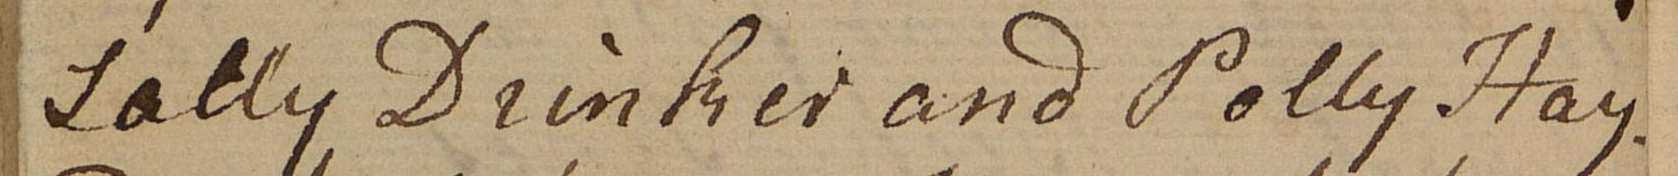Sally Drinker and Polly Hay
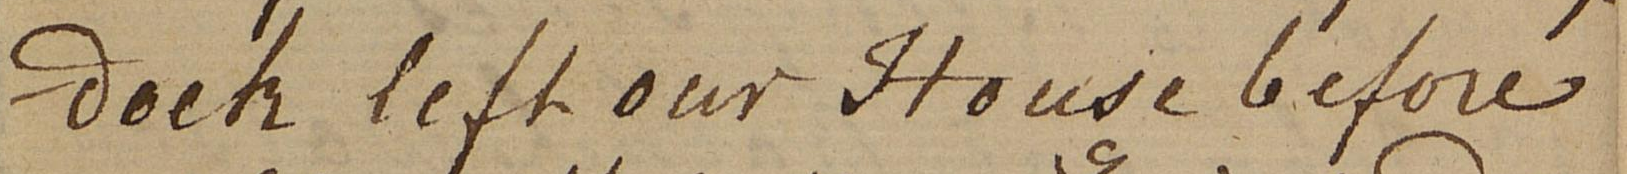-dock left our House before
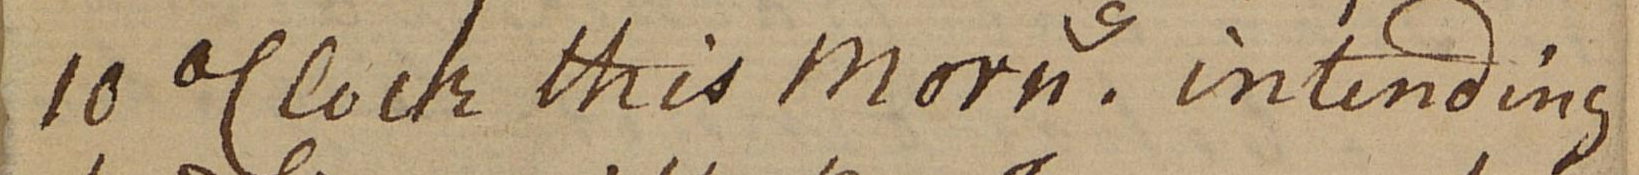10 ^o Clock this Morn^g., intending
